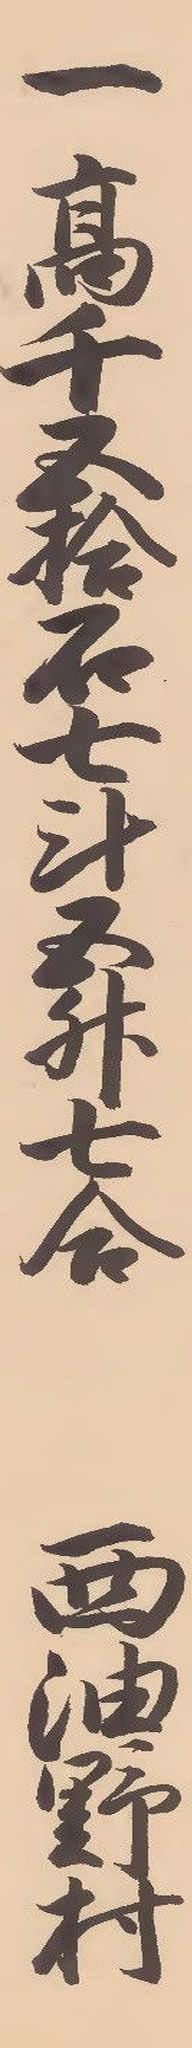一高千五拾石七斗五升七合西油野村
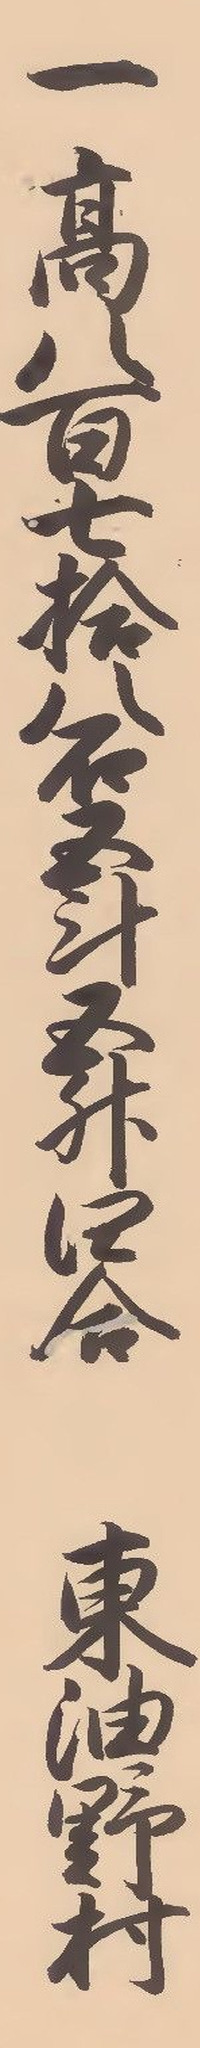一高八百七拾八石五斗五升四合東油野村

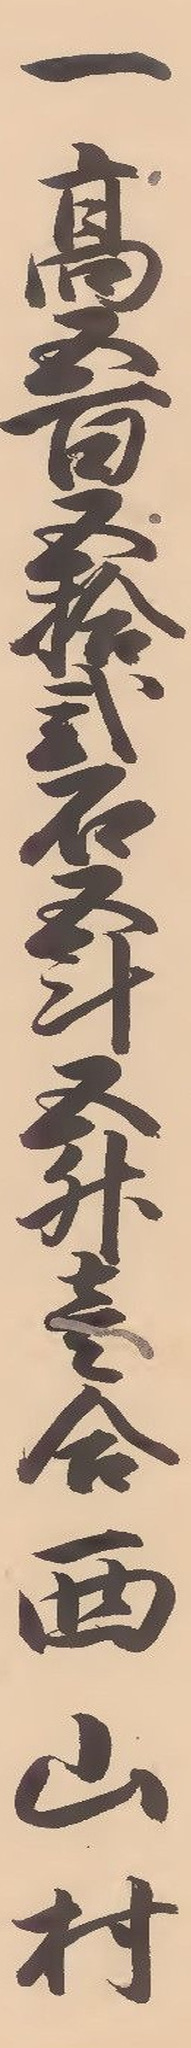一高五百五拾弐石五斗五升壱合西山村
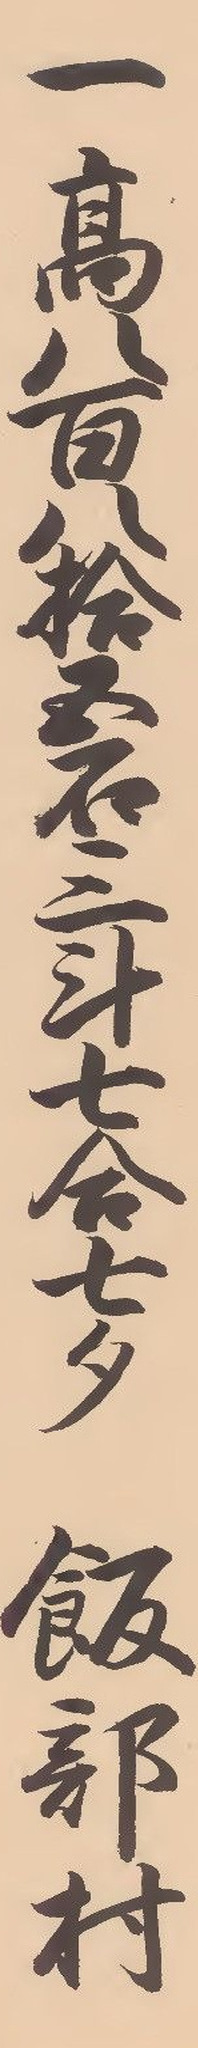一高八百八拾五石三斗七合七勺飯部村
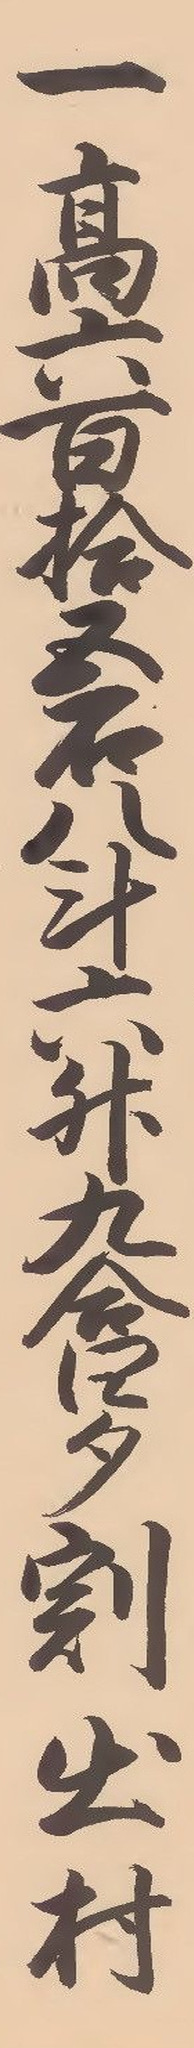一高六百拾五石八斗六升九合四勺割出村
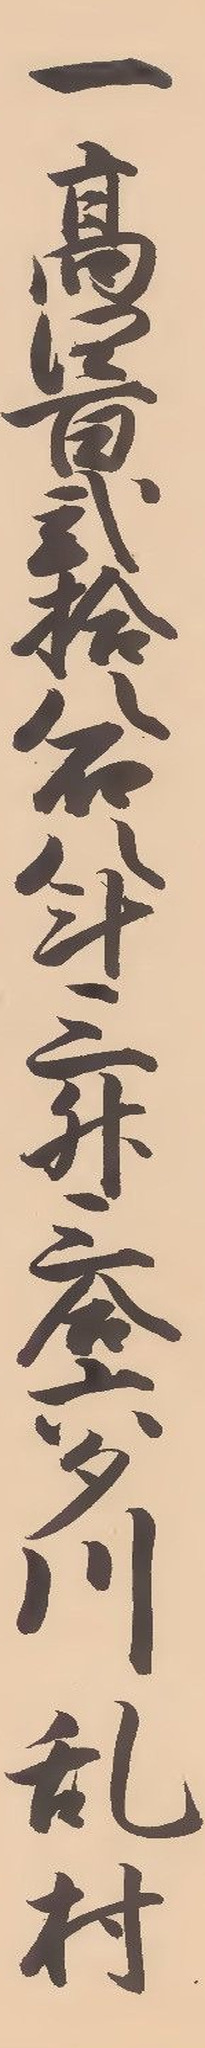一高四百弐拾八石八斗三升三合六勺川乱村
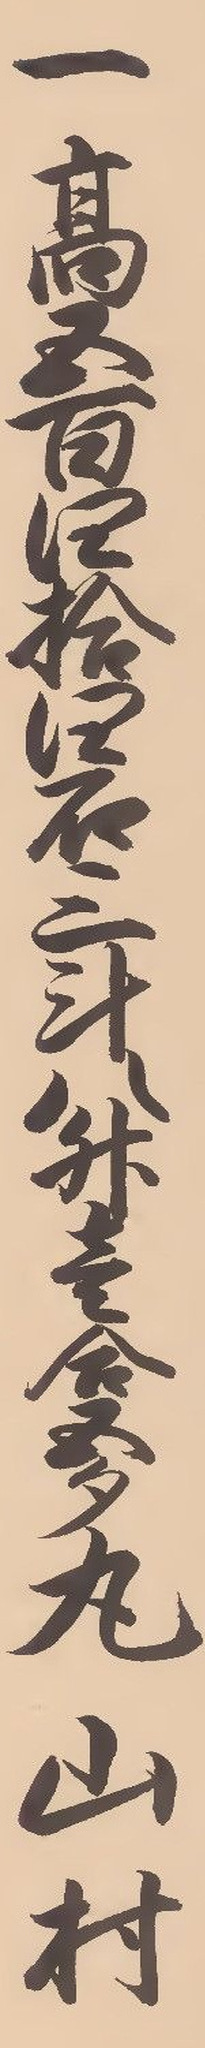一高五百四拾四石三斗八升壱合五勺丸山村
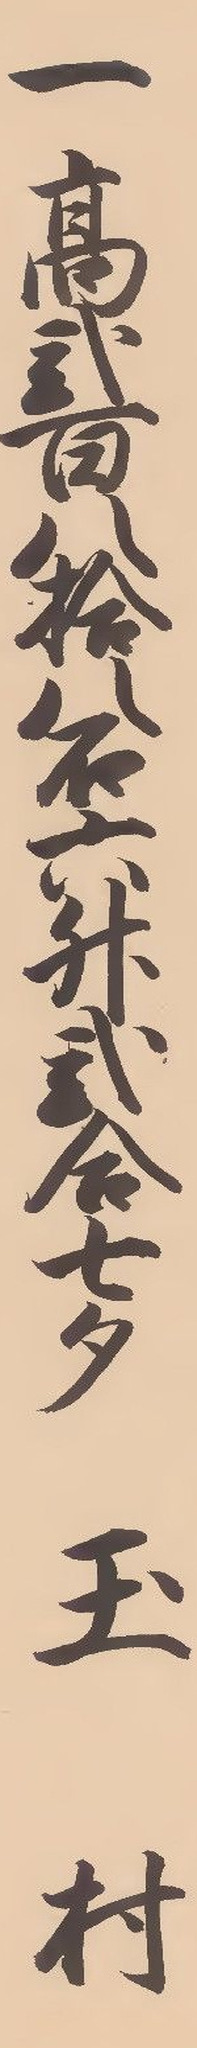一高弐百八拾八石六升弐合七勺玉村
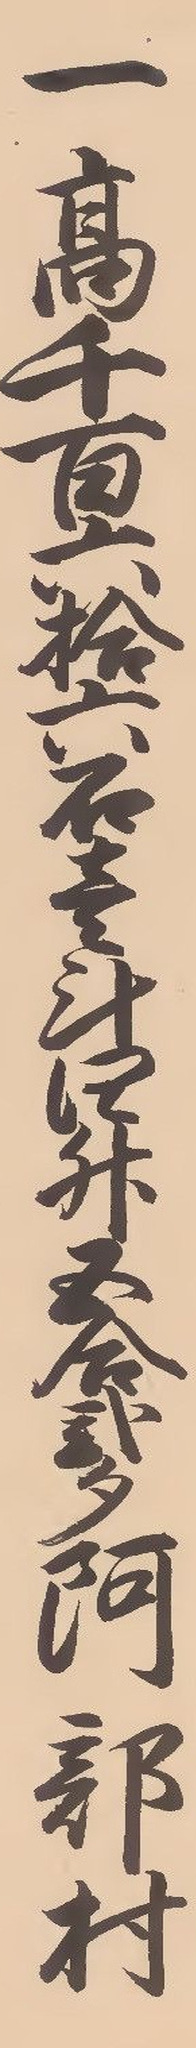一高千百六拾六石壱斗四升五合弐勺阿部村
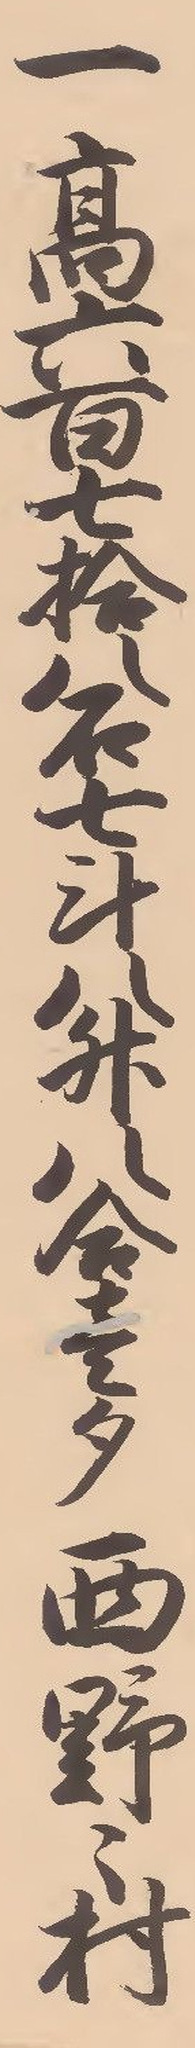一高六百七拾八石七斗八升八合壱勺西野々村

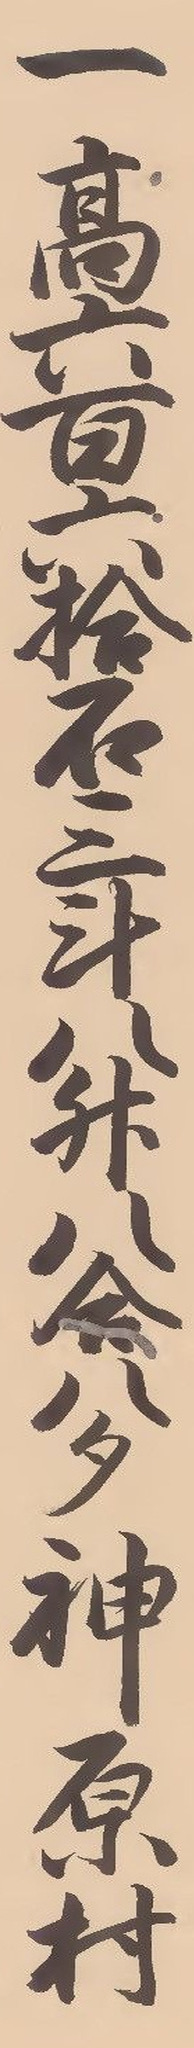一高六百六拾石三斗八升八合八勺神原村
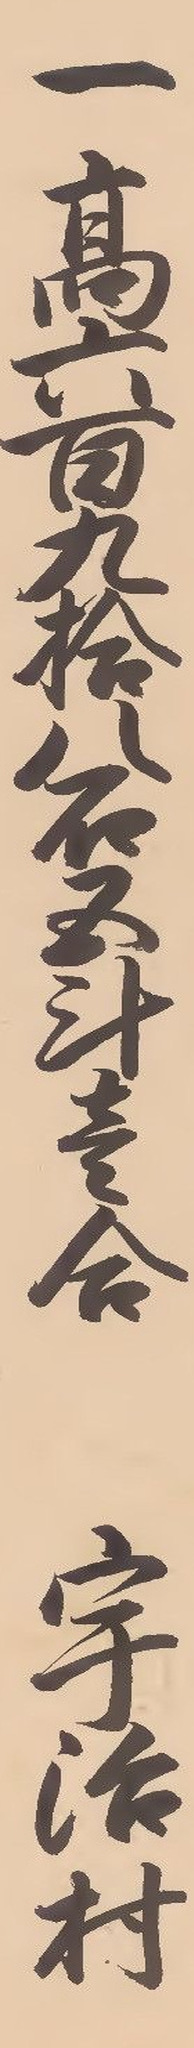一高六百九拾八石五斗壱合宇治村
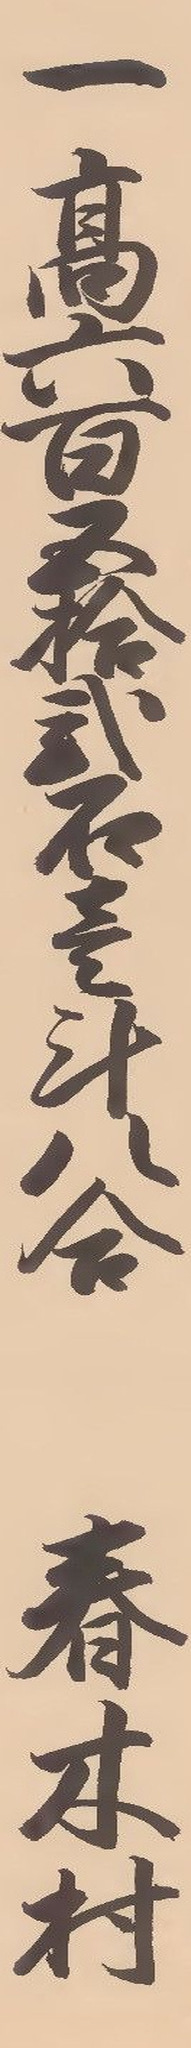一高六百五拾弐石壱斗八合春木村
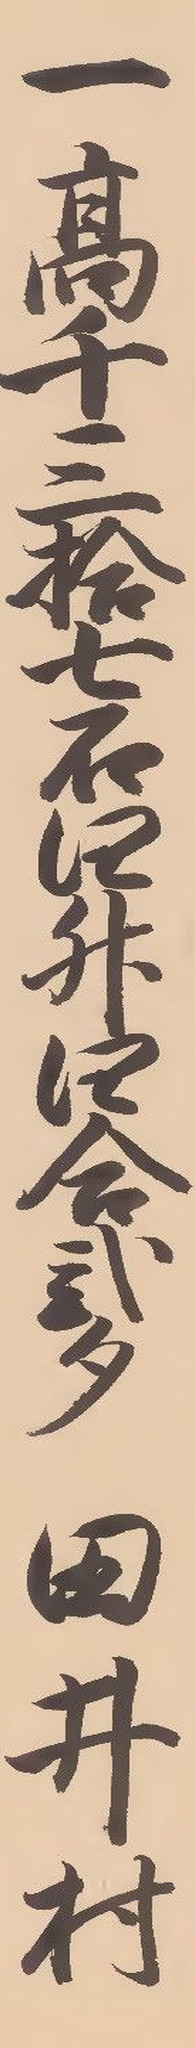一高千三拾七石四升四合弐勺田井村
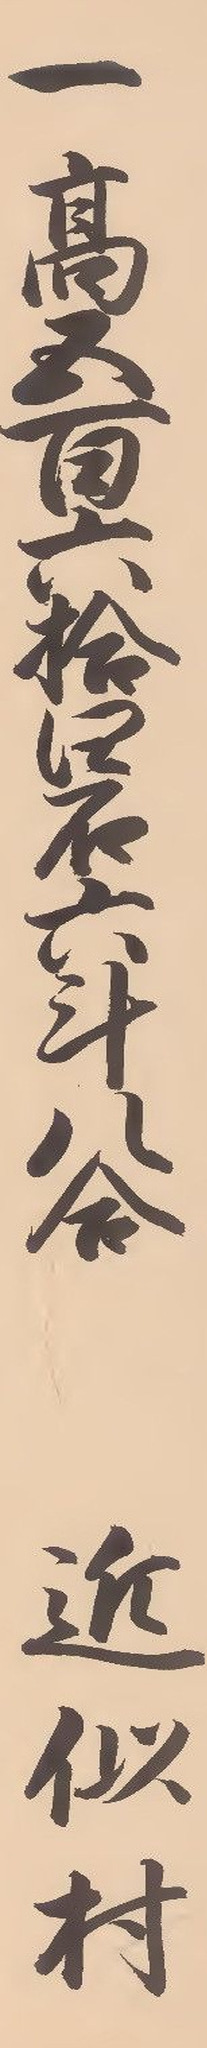一高五百六拾四石六斗八合近似村
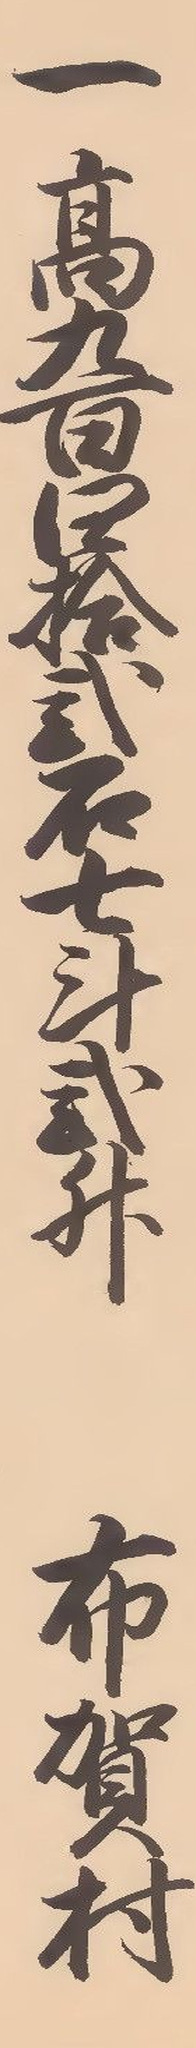一高九百四拾弐石七斗弐升布賀村
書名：備中国郷帳
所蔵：国立公文書館 National Archives of Japan
